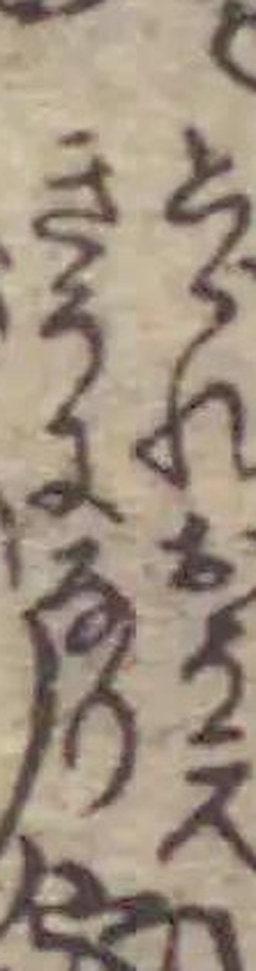きうになり
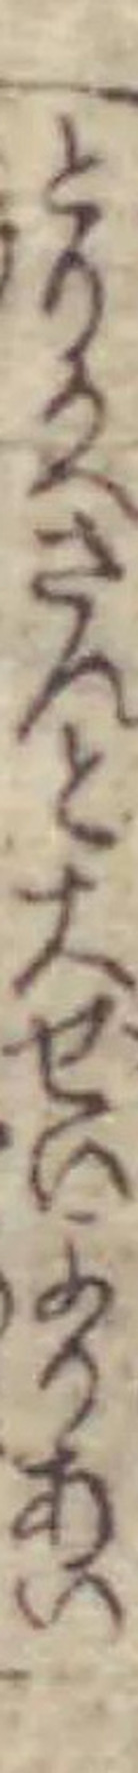とりかへさんと大ぜいよりあい
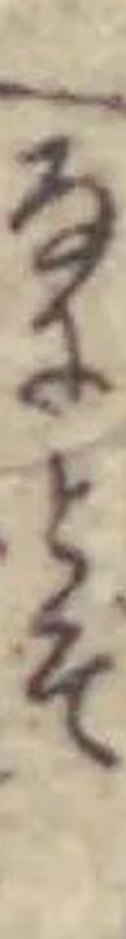なにとぞ
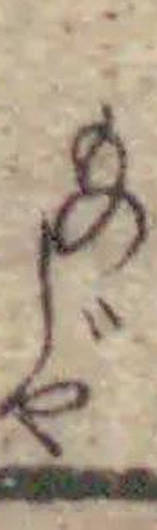ものじや
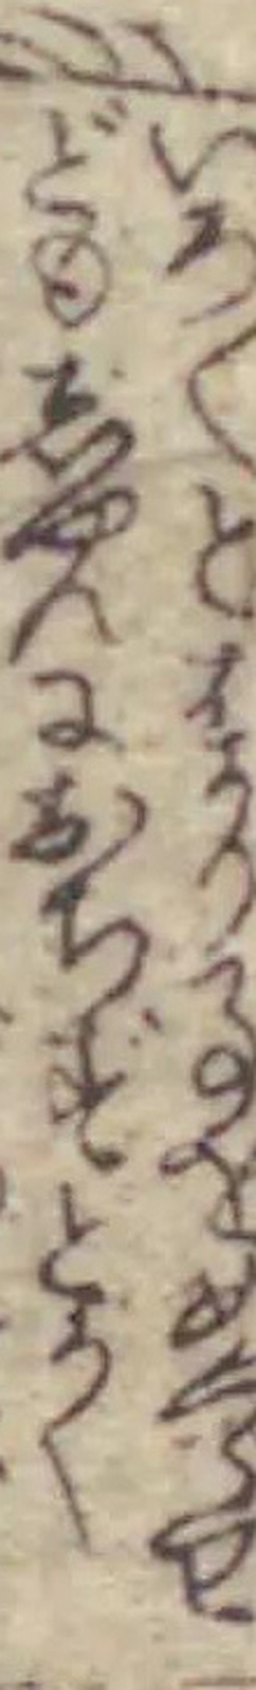どもしやんにおちずとう〳〵
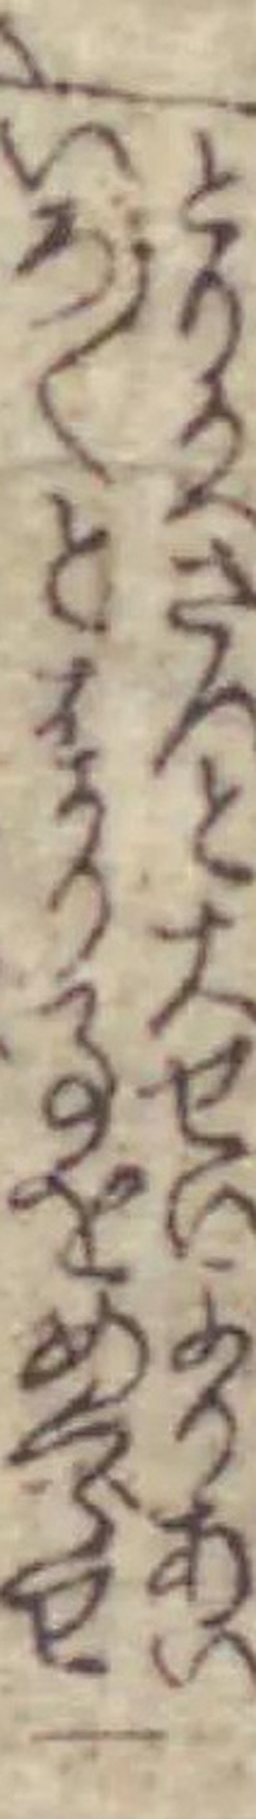いろ〳〵とはかり事をめくらせ
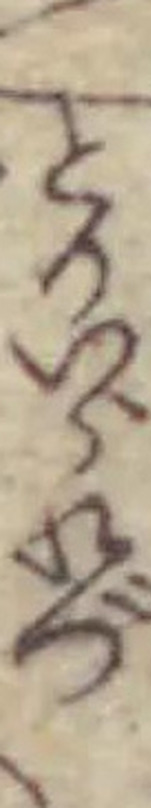とりいられづ
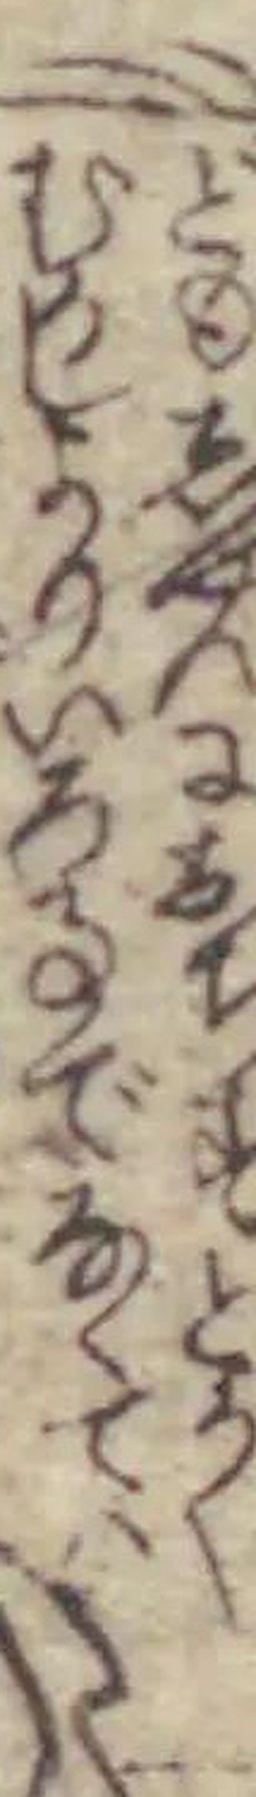むかしよりいろ事でなくては
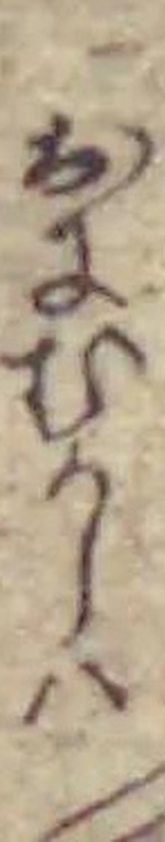おにむかしは
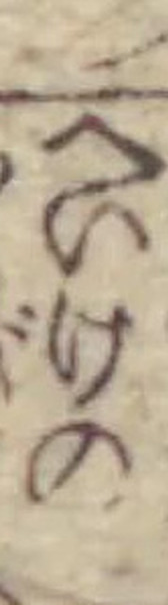へいけの
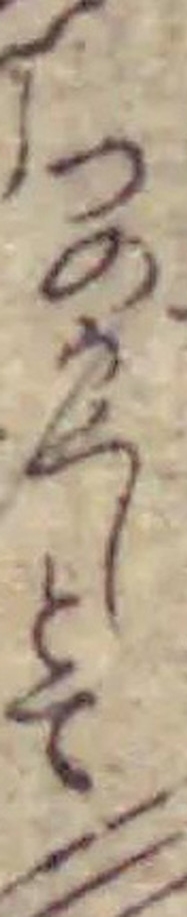つのかくしとて
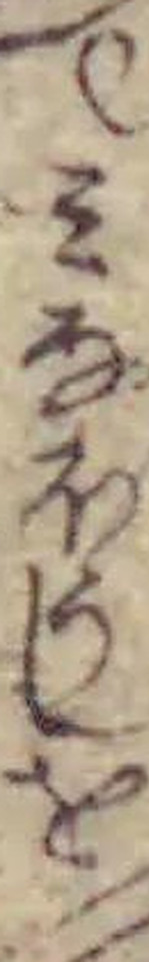みなほうしを
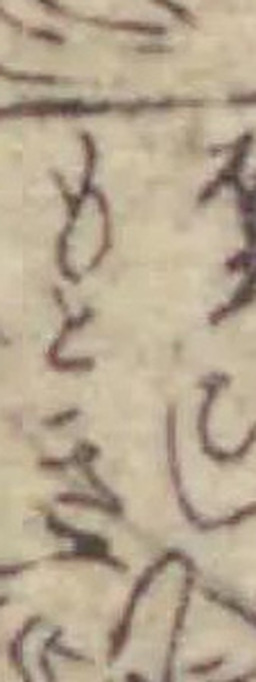もとき
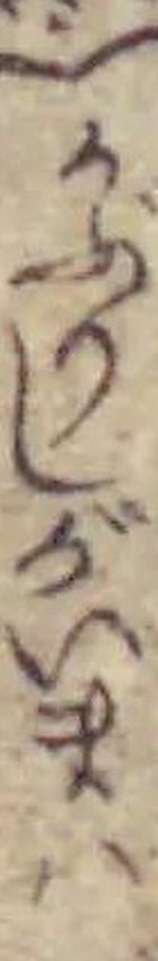かぶりしがいまは
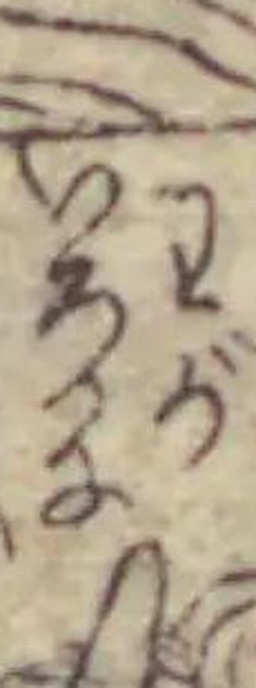いろかに
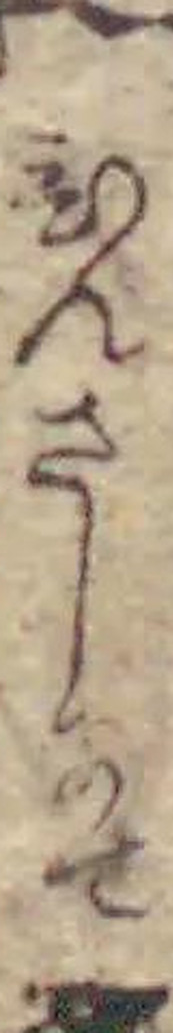ひんさしにて
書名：桃太郎元服姿 2巻
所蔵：国立国会図書館 National Diet Library, JAPAN
